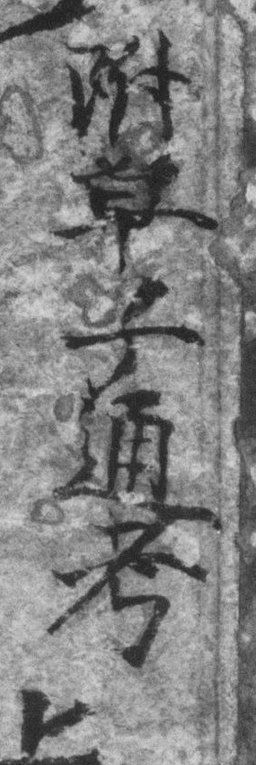附草子通考上

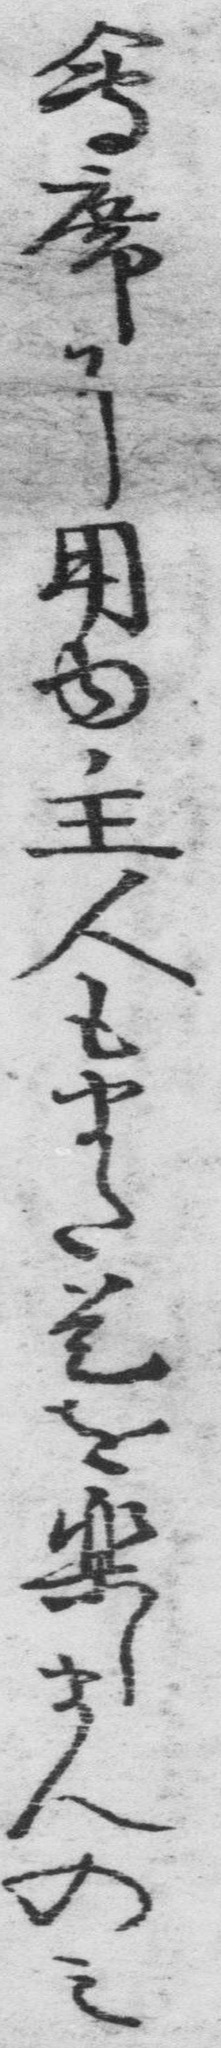會席に用ゆ主人もまた是を楽しまんのみ
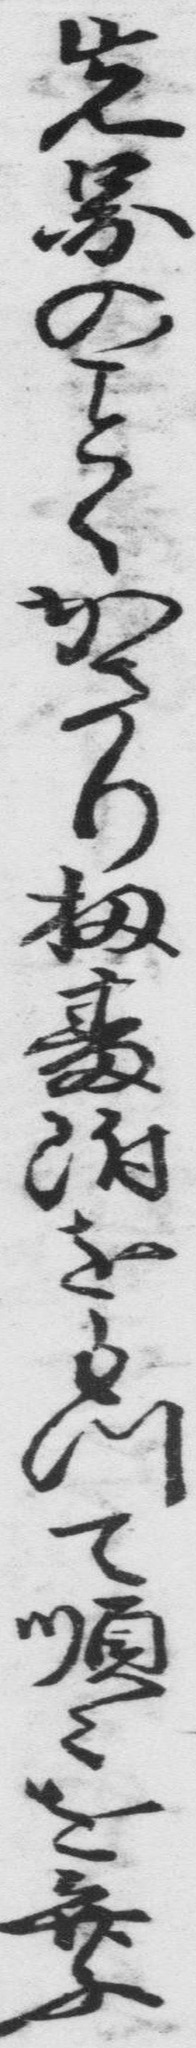先図のことくかたり扨番附をもつて順々を弁ふ
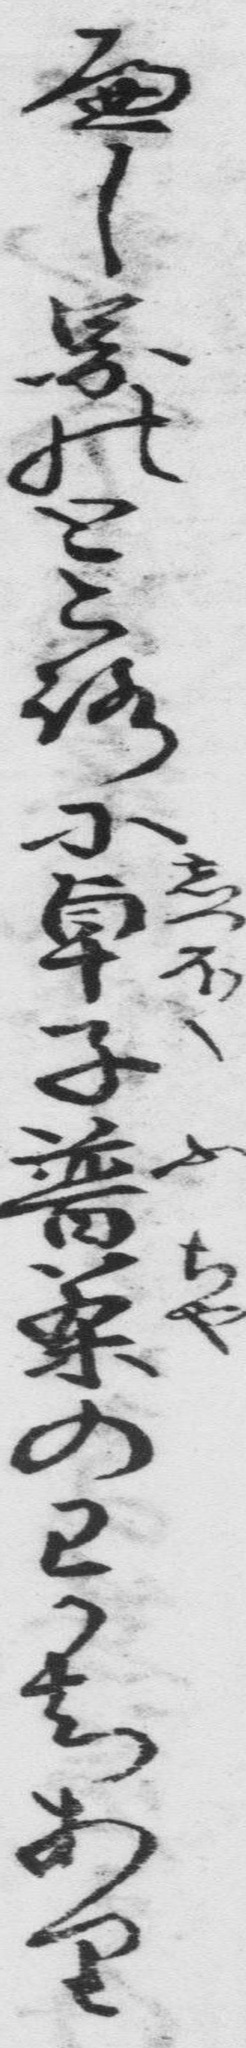へし図のところに卓子普茶のわかちあり
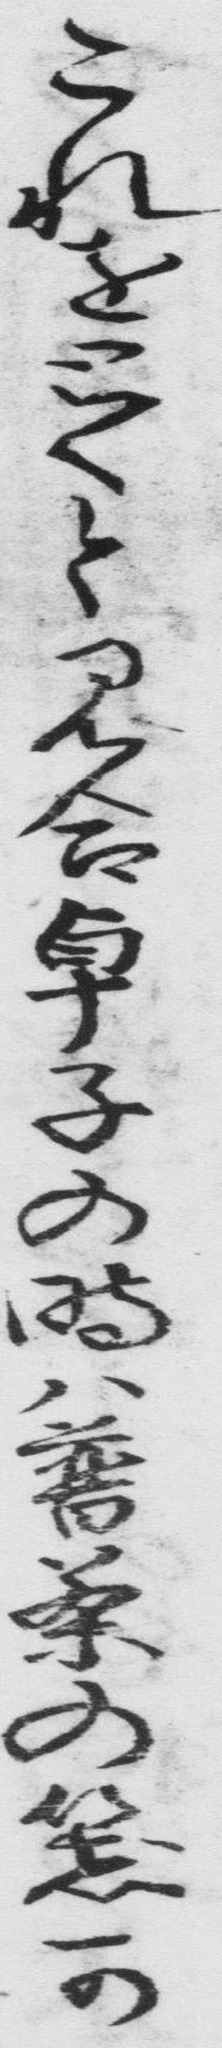これをとくと見合卓子の時は普茶の器可
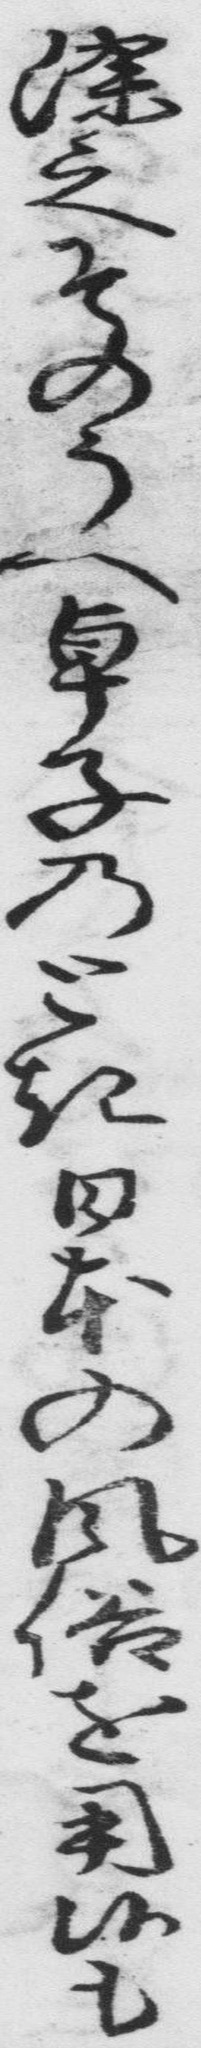深之そのうへ卓子のとき日本の風俗を用候も
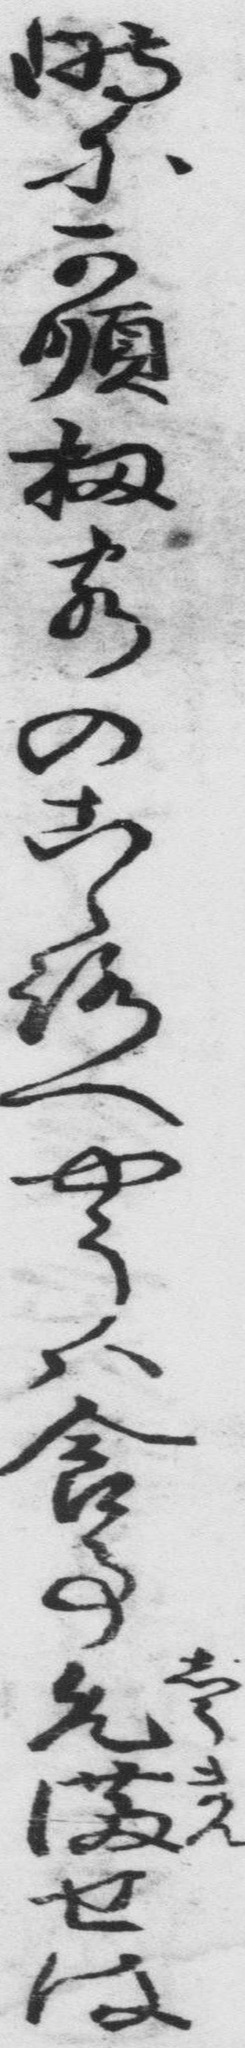時尓可順扨前のこゝろへやうは食事充満せは
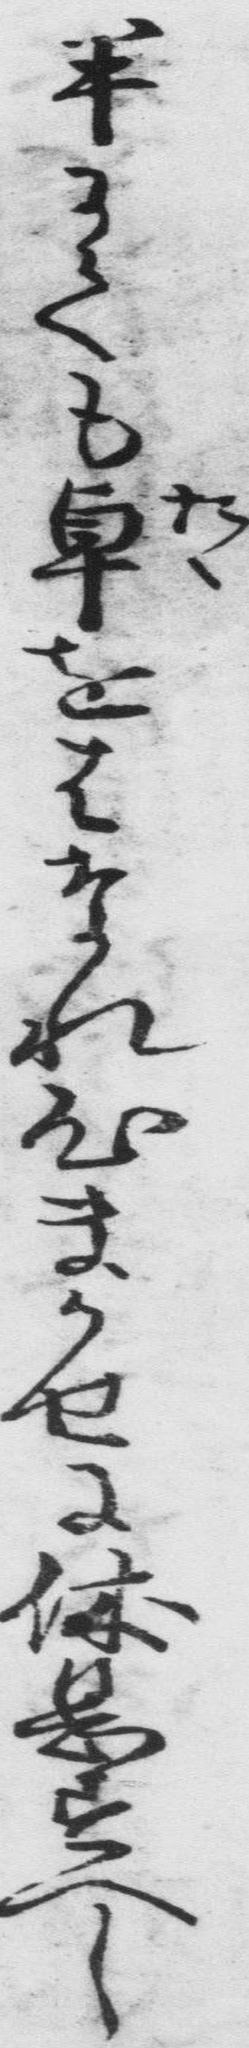半にても卓をはなれ心まかせに休息すへし
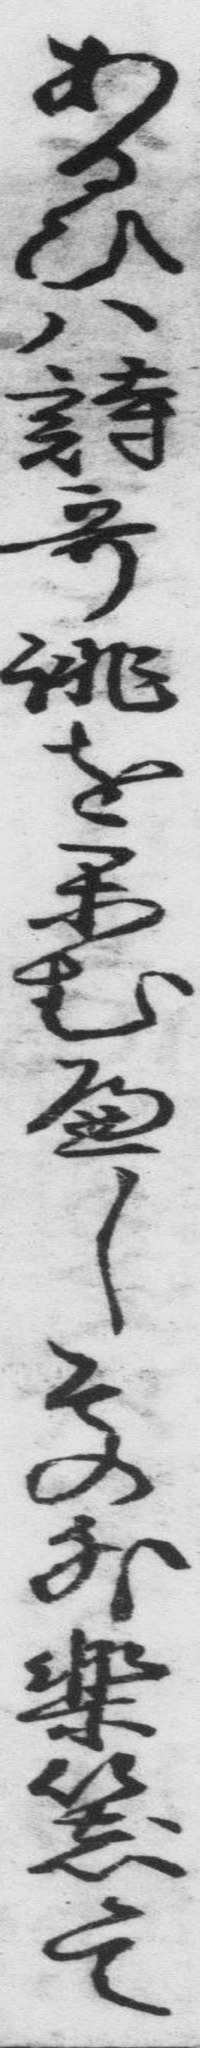あるひは詩哥誂を果むへしその外楽器にて
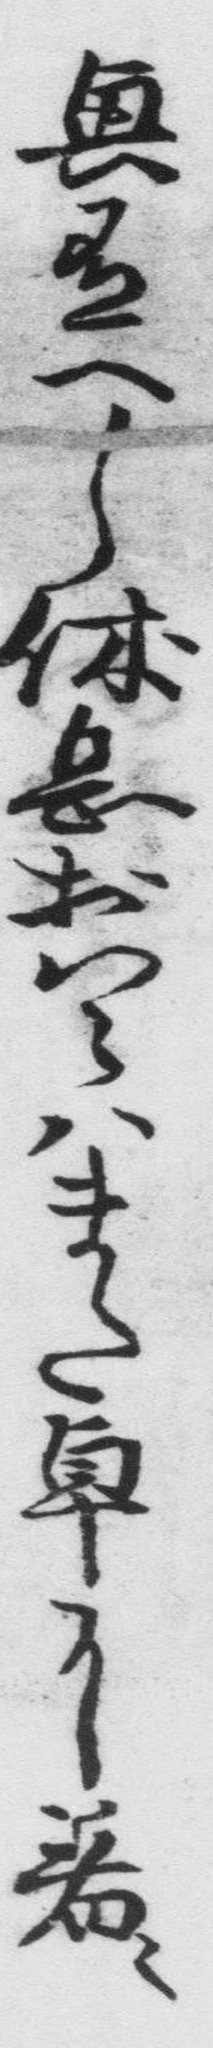興有へし休息おはらはまた卓に着く

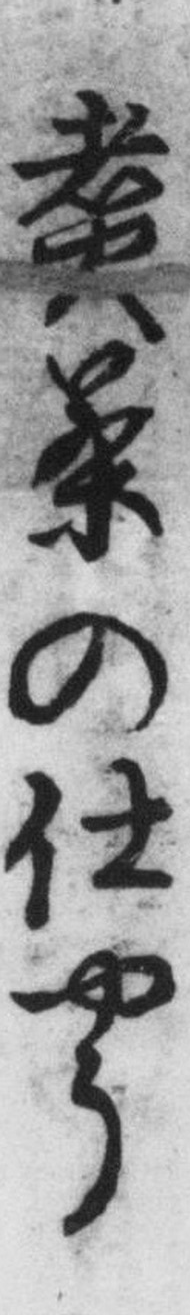煮茶の誌仕やう
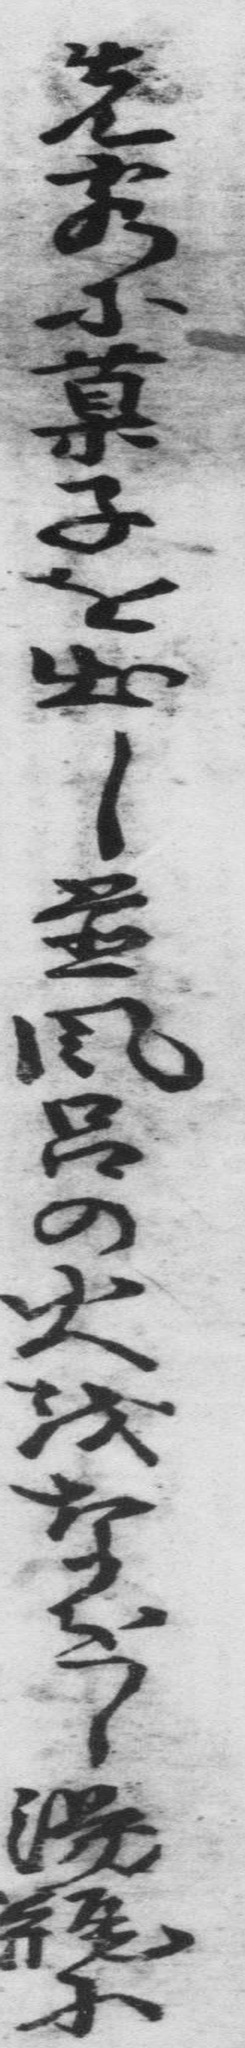先客尓菓子を出し置風呂の火越なをし湯瓶尓
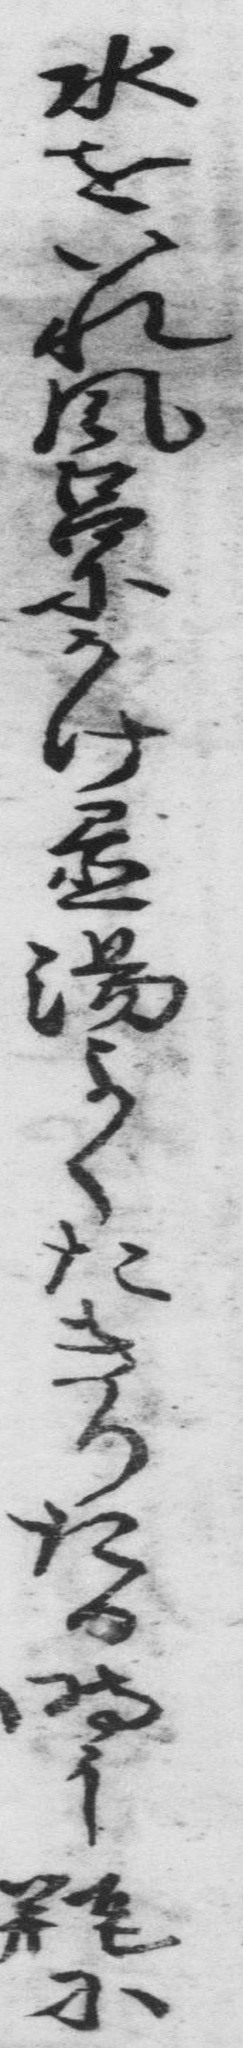水をいれ風呂尓かけ置湯よくたきりたる時耳瓶尓
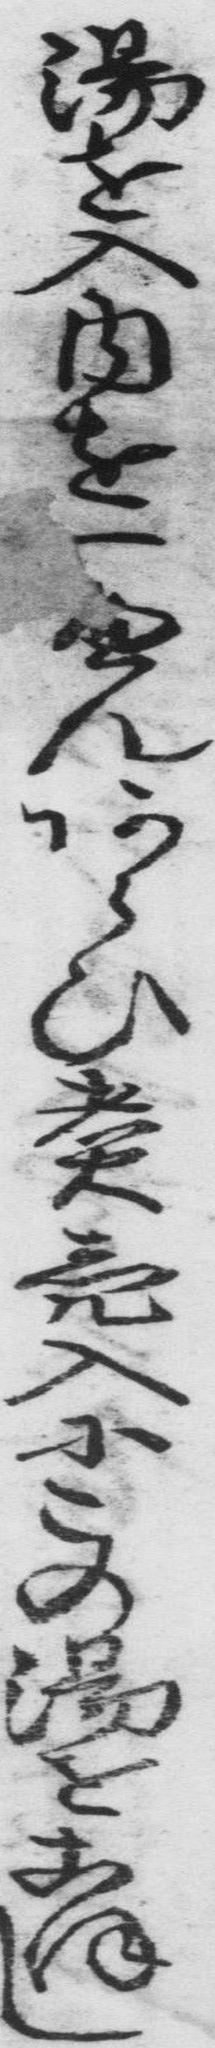湯を入内を一扁ん阿らひ煮売入尓この湯を古ほし
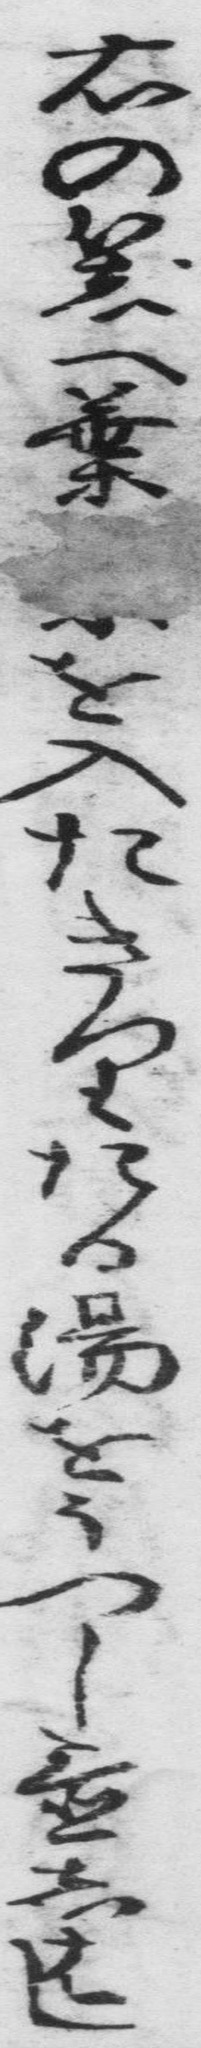右の器へ葉茶を入たき里たる湯をうつし置志はし
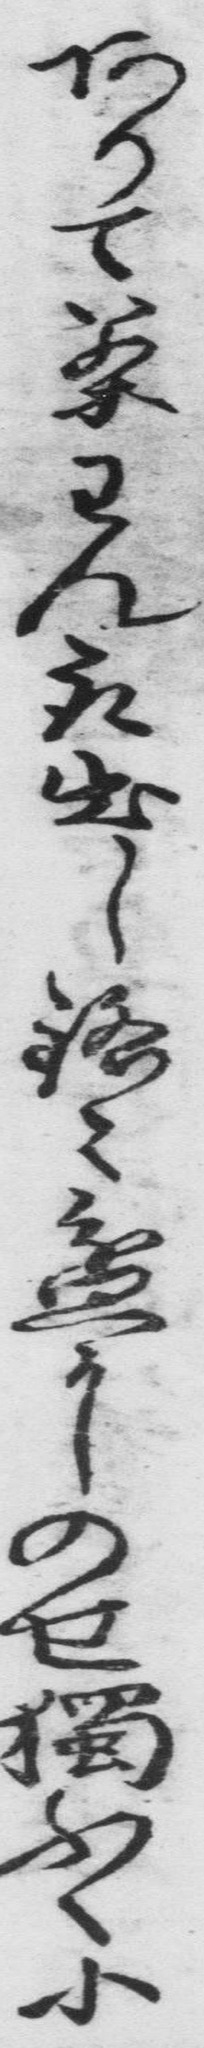阿りて茶わん取出し銘々盃耳のせ獨ふく尓
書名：普茶料理抄
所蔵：大阪府立大学学術情報センター 国文学研究資料館
